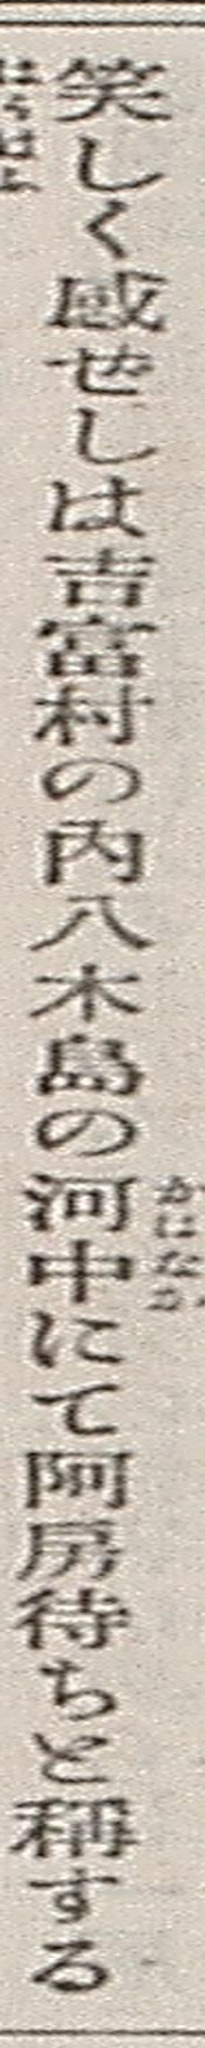笑しく感ぜしは吉富村の内八木島の河中にて阿房待ちと称する
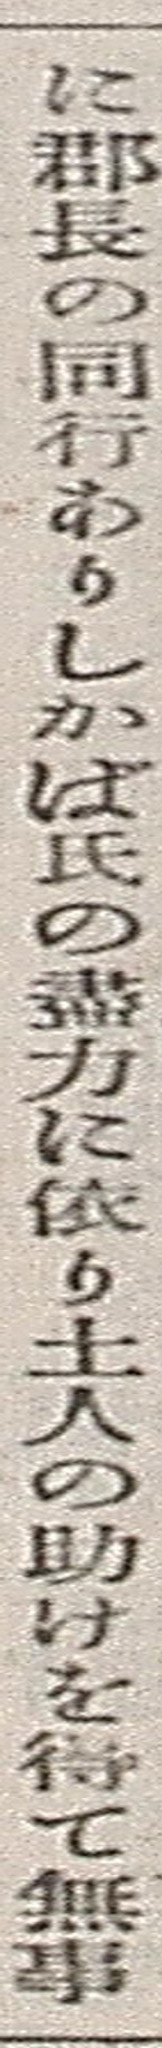に郡長の同行ありしかば氏の尽力に依り土人の助けを得て無事
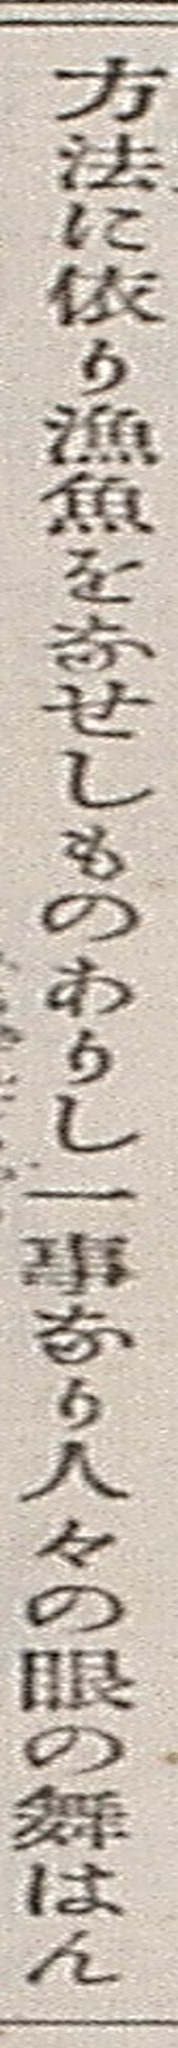方法に依り漁魚をなせしものありし一事なり人々眼の舞はん
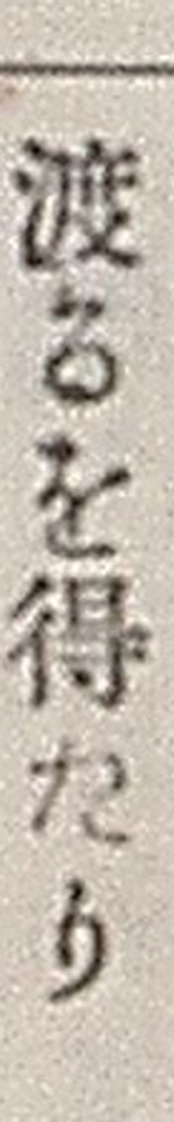渡るを得たり
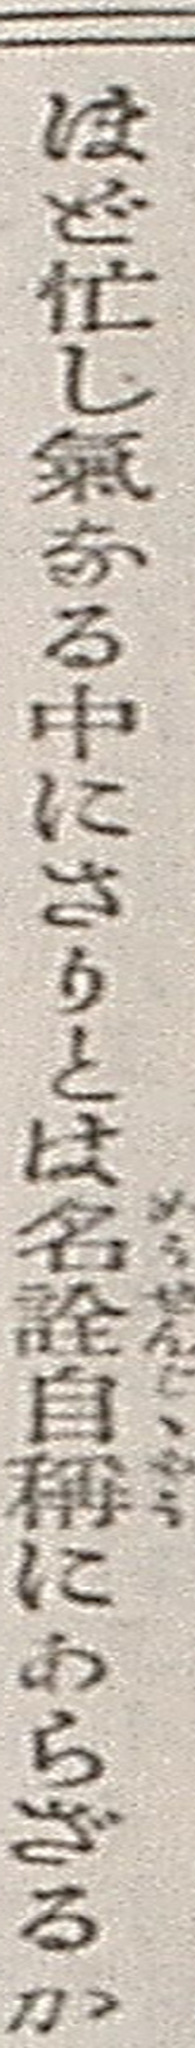ほど忙し気なる中にさりとは名詮自称にあらざるか
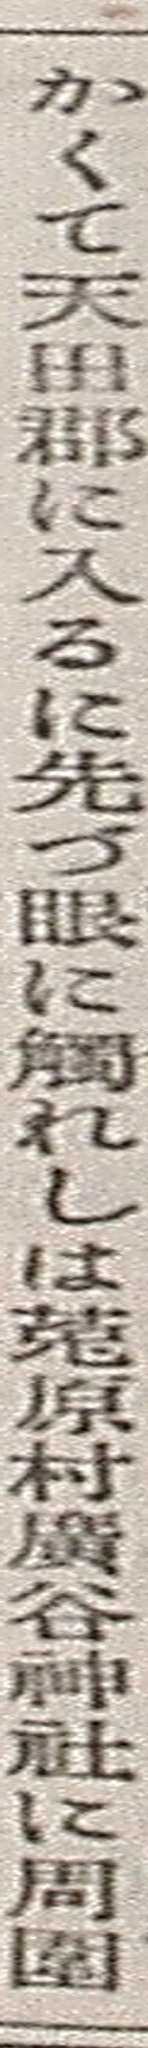かくて天田郡に入るに先づ眼に触れしは莵原村広谷神社に周囲
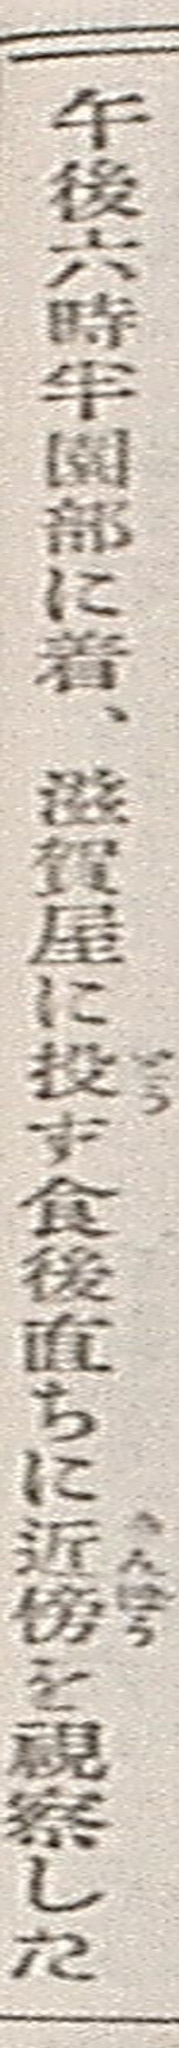午後六時半園部に着、慈賀屋に投ず食後直ちに近傍を視察した
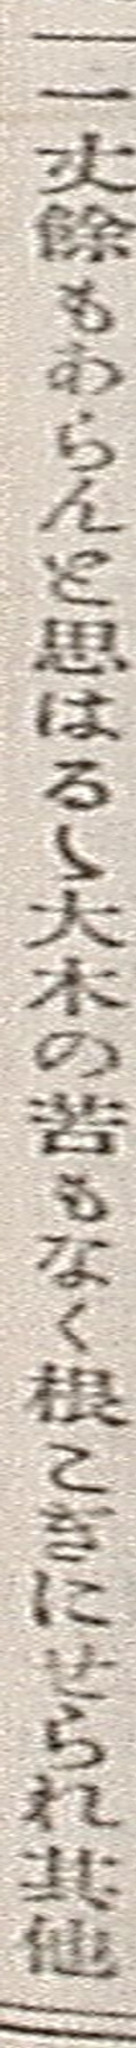一丈餘もあらんと思はるゝ大木の苦もなく根こそぎにせられ其他
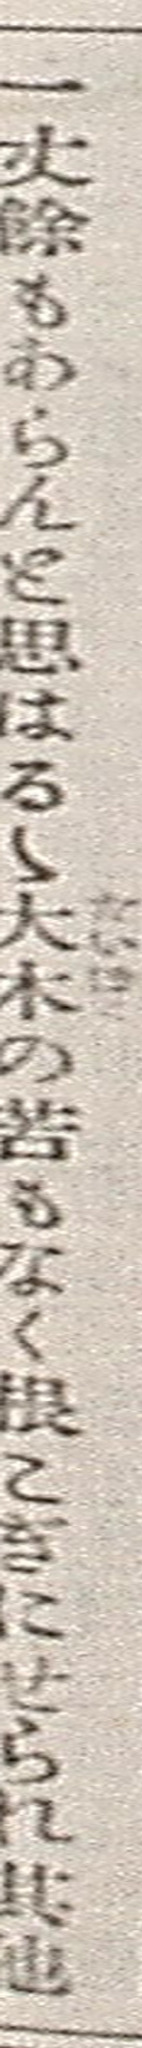一丈餘もあらんと思はるゝ大木の苦もなく根こそぎにせられ其他
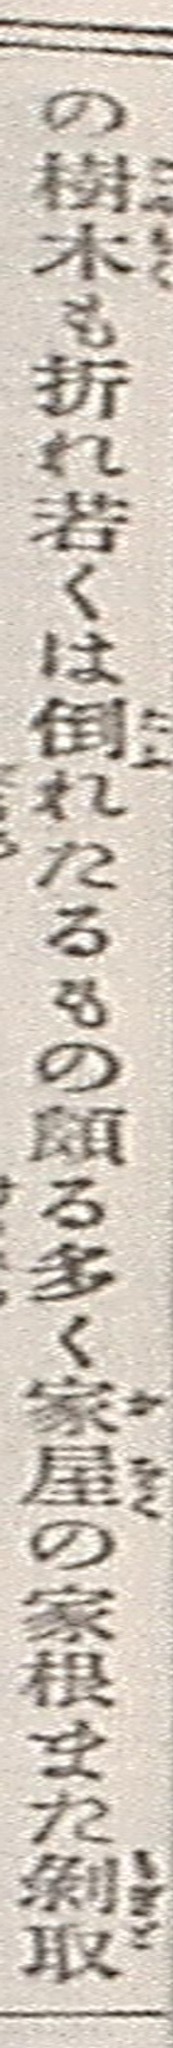の樹木も折れ若くは倒れたるもの頗る多く家屋の家根また剥取
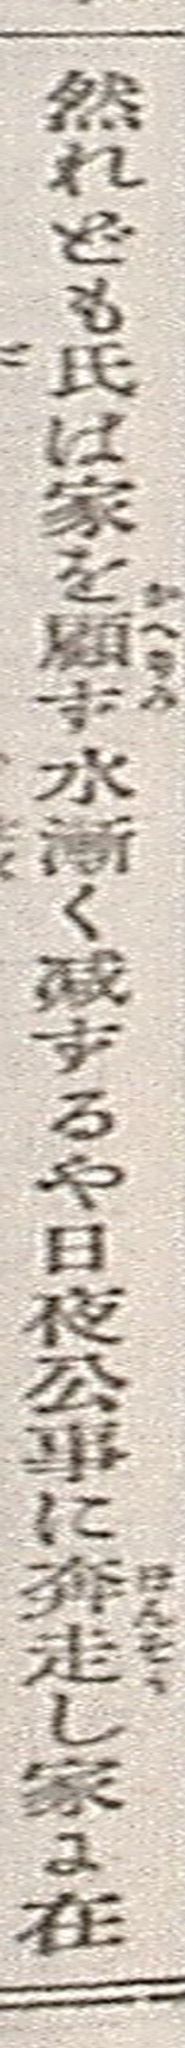然れども氏は家を顧ず翠漸く減ずるや日夜公事に奔走し家に在
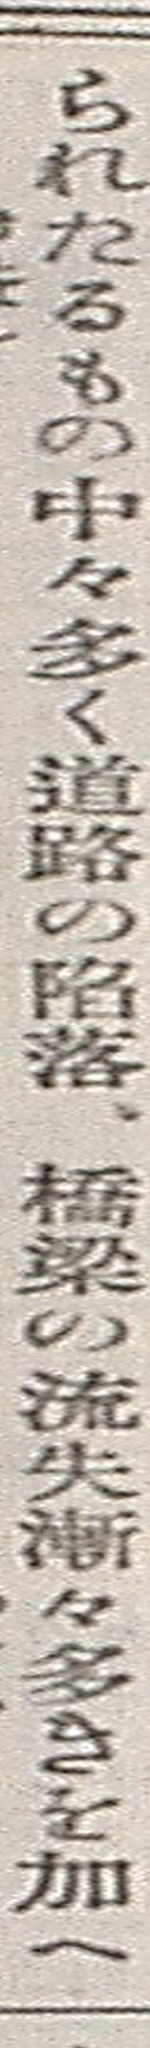られたるもの中々多く道路の陥落、橋梁の流失漸々多きを加へ
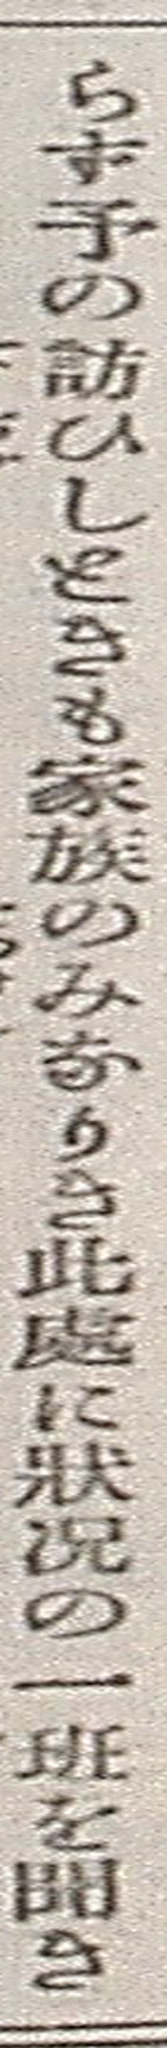らず予の訪ひしときも家族のみなりき此処に状況の一班を聞き
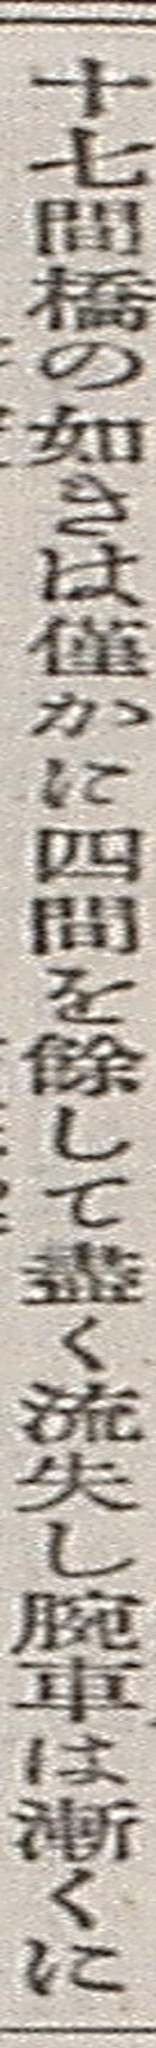十七間橋の如きは僅かに四間を餘して尽く流失し腕車は漸くに
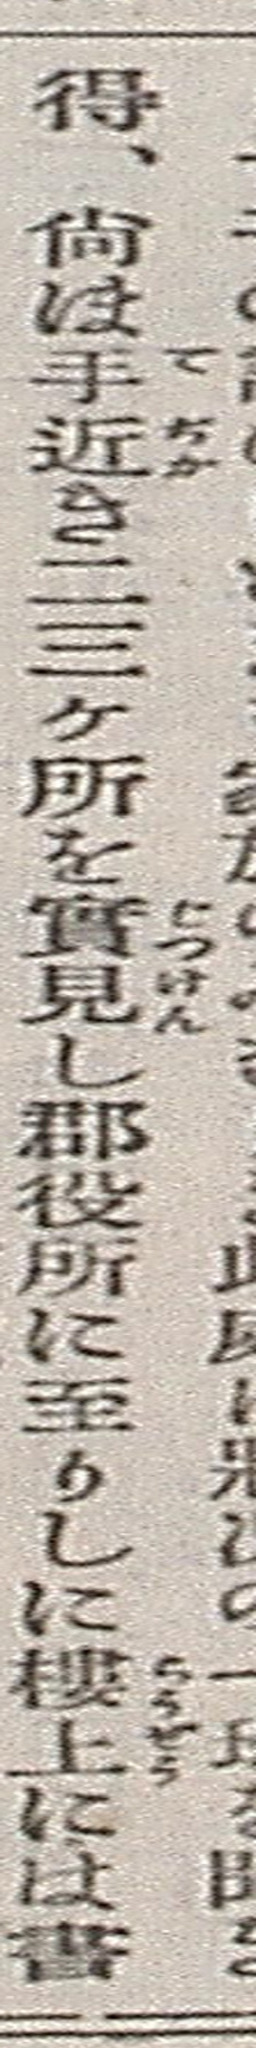得、尚ほ手近き二三ヶ所を実見し郡役所に至りしに楼上には書
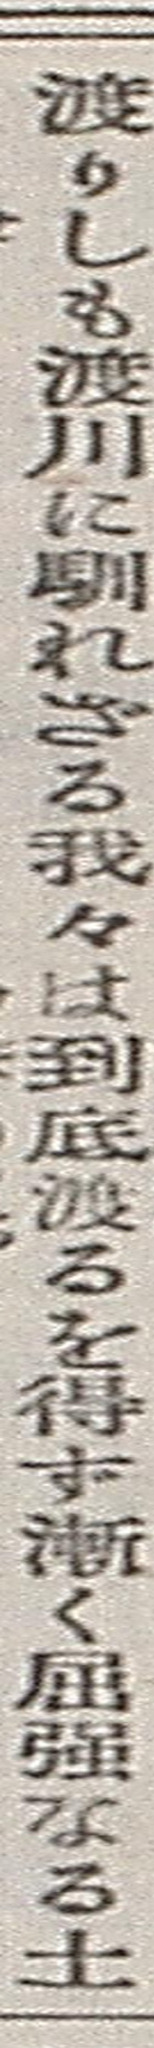渡りしも渡川に馴れざりる我々は到底渡るを得ず漸く屈強なる土
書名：風俗畫報臨時増刊第百二十六號　洪水被害録（中）
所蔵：東京大学地震研究所図書室 Earthquake Research Institute Library, The University of Tokyo, JAPAN
